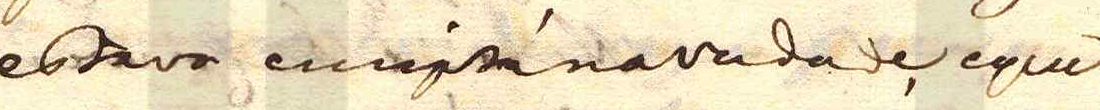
estava escripta na verdade, e que
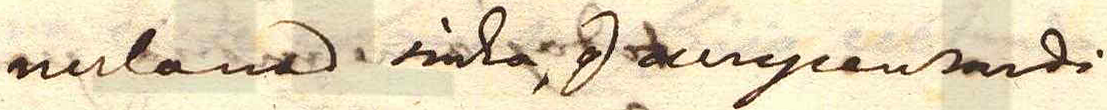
nesta naõ tinha, q̄ acrescentar di
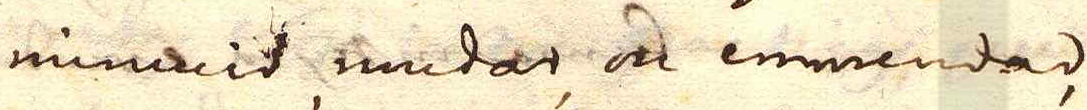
minuir, mudar ou emmendar,
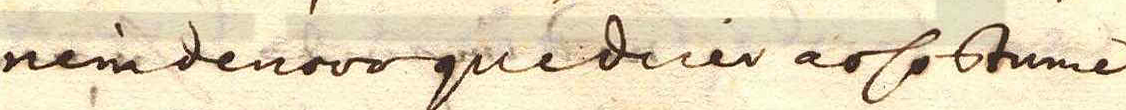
nem de novo que dizer ao Costume
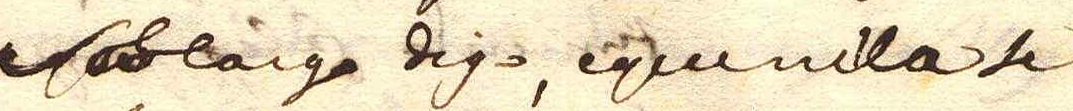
e sob cargo digo, e que nella se
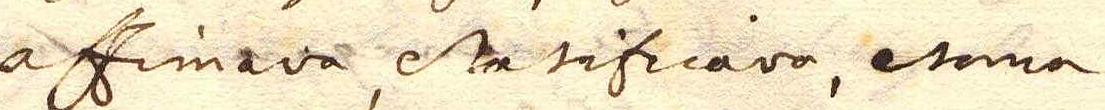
affirmava, e Ratificava, e torna
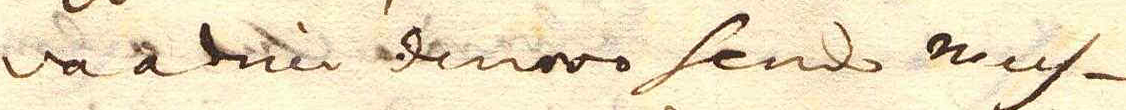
va a dizer de novo sendo neces
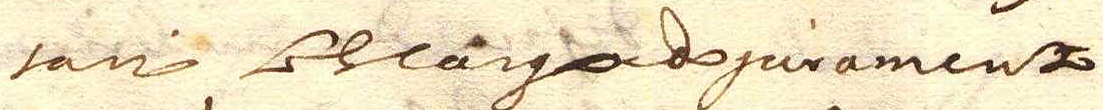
sario, sob cargo do juramento
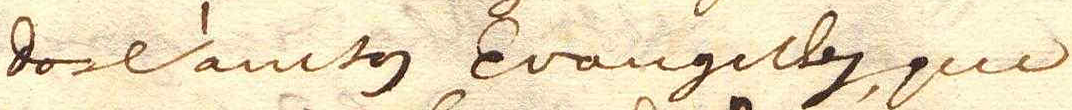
dos sanctos Evangelhos, que
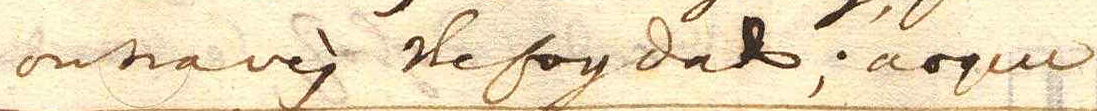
outra vés lhe foy dado; ao que
